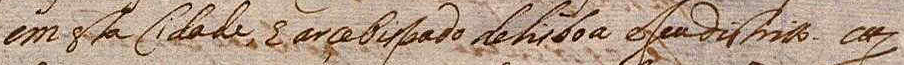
em esta Cidade, E arcebispado de lisboa e seu distritto ctt
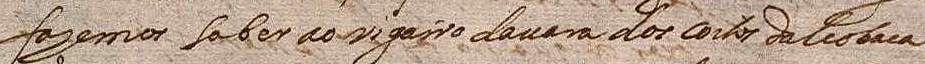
fazemos saber ao vigairo da uara dos coitos dalcobaça
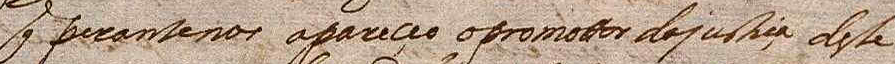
q̄ perante nos apareceo o promottor da justiça deste
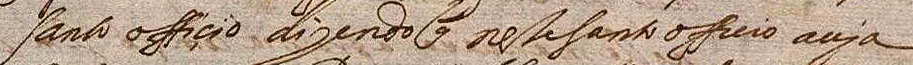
Santo officio dizendo q̄ neste santo officio auja
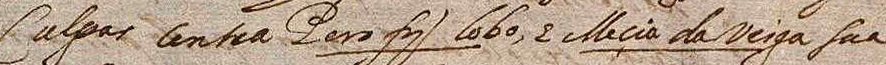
Culpas contra Pero frz̄ lobo, E Mecia da veiga sua
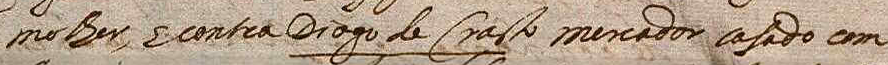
molher, E contra Diogo Crasto, mercador casado com
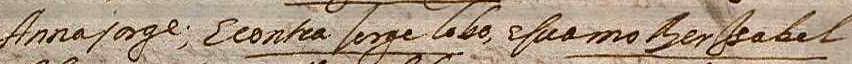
Anna jorge; E contra Jorge lobo, E sua molher Jsabel
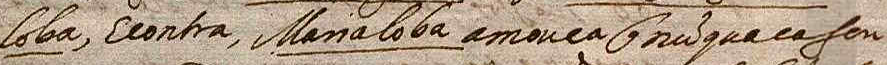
loba, E contra, Maria loba a mouca q̄ nūqua casou
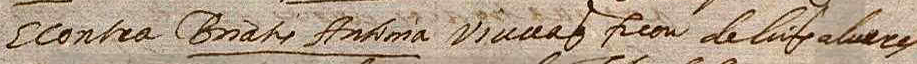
E contra Briatis Antonia viuua q̄ ficou de luis aluares
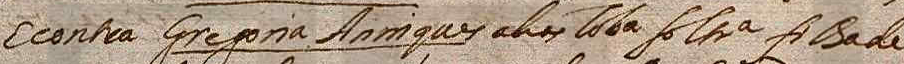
E contra Gregoria Anrriques alias loba soltra filha de
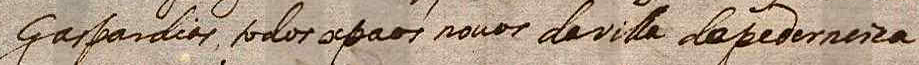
Gaspar dias, todos xpaos̄ nouos da villa da pederneira
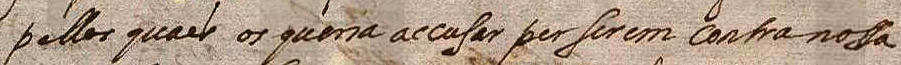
pellos quaes os queria accusar per serem contra nossa
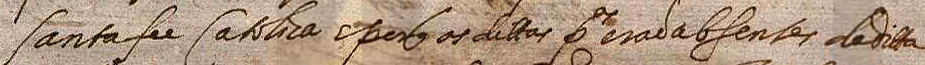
Santa fee Catolica E porq̄ as dittas pas eraõ absentes da ditta
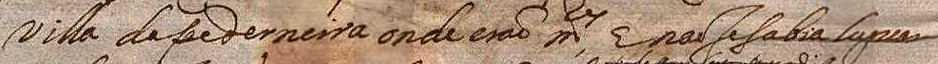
villa da pederneira onde eraõ mres, E naõ se sabia luguar
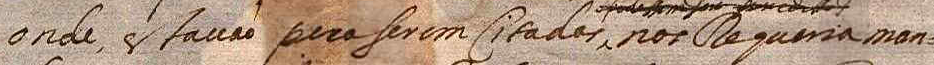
onde, estauaõ pera serem Citadas nos Requeria man
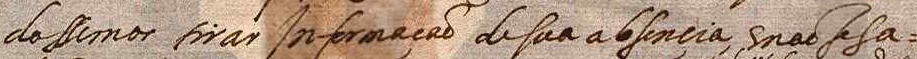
dassemos tirar Jnformaçaõ de sua absencia, E naõ se sa
